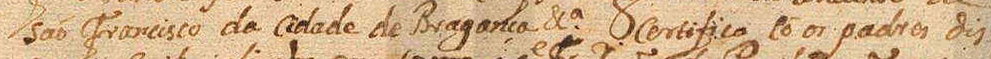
saõ Francisco da Cidade de Bragança &a. Certifica cō os padres dis
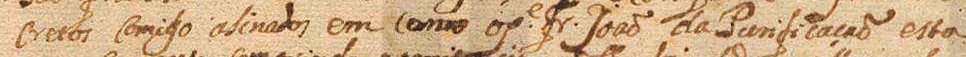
cretos Comigo asinados em como o p.e Fr. Joaõ da Purificaçaõ esta
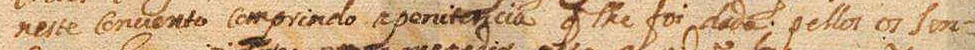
neste Conuento cumprindo a penitencia q̄ lhe foi dada; pellos os sen
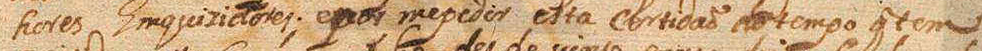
hores Jmquizidores; e por me pedir esta certidaõ do tempo q̄ tem
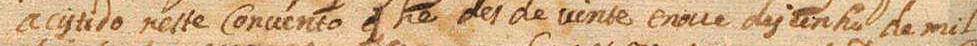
acistido neste Conuento q̄ he desde uinte e noue de junho de mil
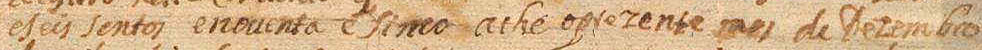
e seissentos e nouenta e sinco athe o prezente mes de Dezembro
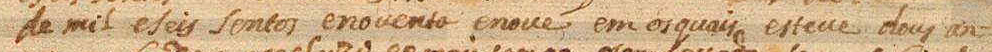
de mil e seissentos e nouenta e noue em os quais esteue dous an
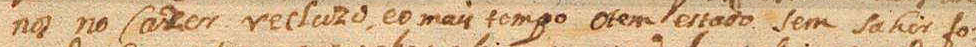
nos no Carcer recluzo, e o mais tempo o tem estado sem sahir fo
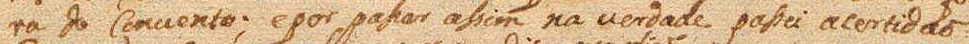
ra do Conuento e por passar assim na uerdade passei a certidaõ
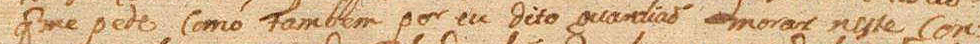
q̄ me pede como tambem por eu dito guardiaõ _ morar neste Con
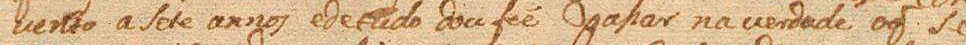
uento a sete annos e de tudo dou feé passar na uerdade o q̄ se
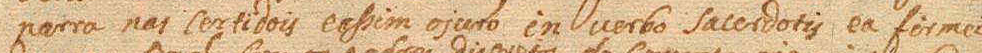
parra nas certidois, e assim o juro in uerbo Sacerdotis, e a firmei
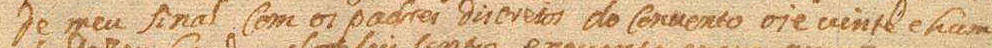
de meu sinal com os padres discretos do Conuento oie uinte e hum
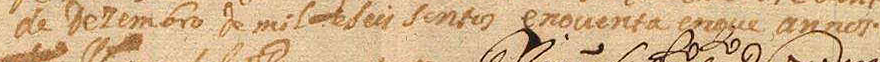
de Dezembro de mil e seissentos e nouenta noue annos.
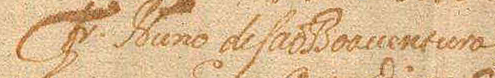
Fr. Nuno de Saõ Boauentura
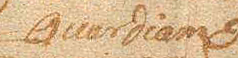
Guardiam
